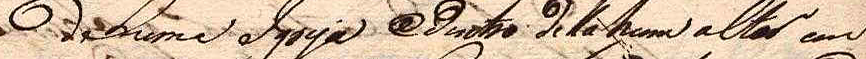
de huma Igreja e dentro della hum altar em
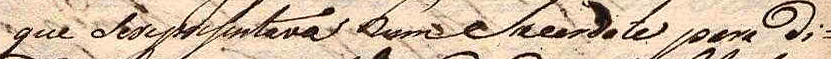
que se representava hum Sacerdote para di
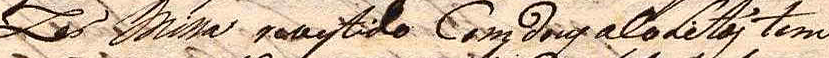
Zer Missa revestido Com dous acolitos tam
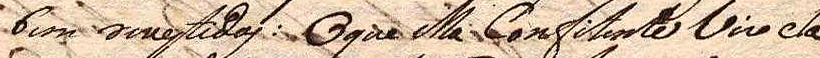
bem reuestidos: O que ella Confitente Viu cla
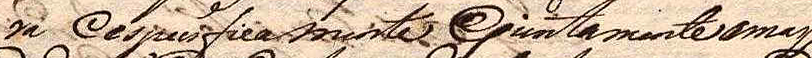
ra e especificamente e juntamente a may
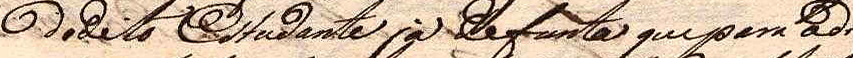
do dito estudante ja defunta que para a di
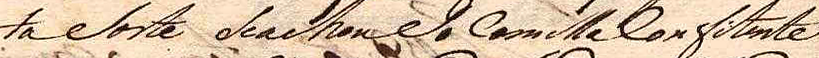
ta sorte se achou so com ella Confitente
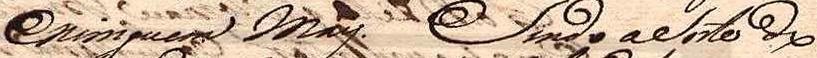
e ninguem mais Sendo a sorte do
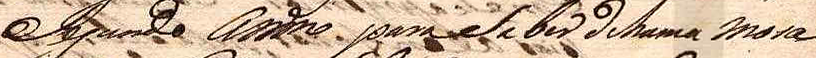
Segundo anno para saber de huma mosa
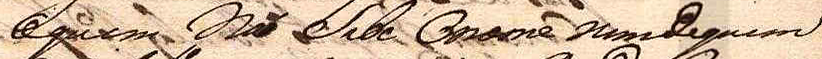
a quem naõ sabe o nome nem de quem
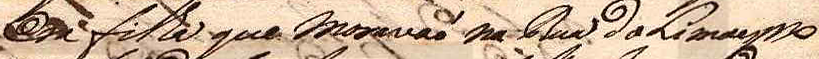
era filha que moravaõ na Rua do Limoeyro
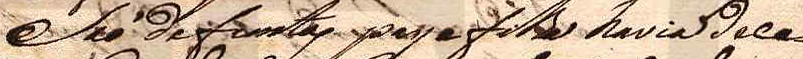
Saõ defuntas pay e filha havia de ca
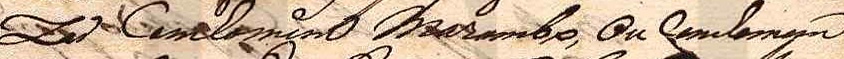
Zar Com homem Mazambo, ou com homem
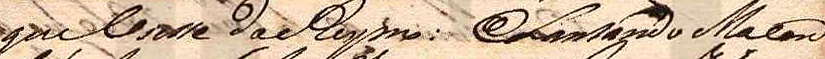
que Viesse do Reyno: e Lansando ella con
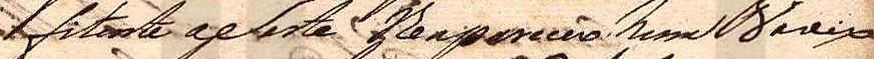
fitente a Sorte lhe apareceo hum Navio
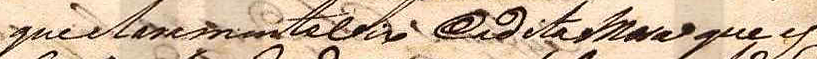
que claramente vio e a dita mosa que es
